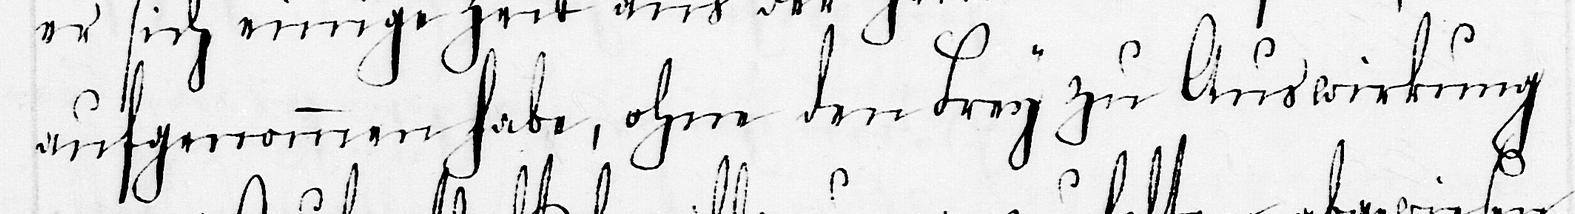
aufgenommen habe, ohne den Frey zu Auswirkung
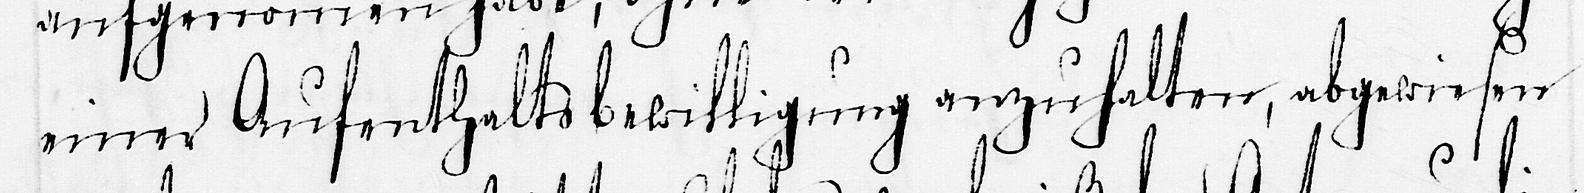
einer Aufenthaltsbewilligung anzuhalten, abgewiesen
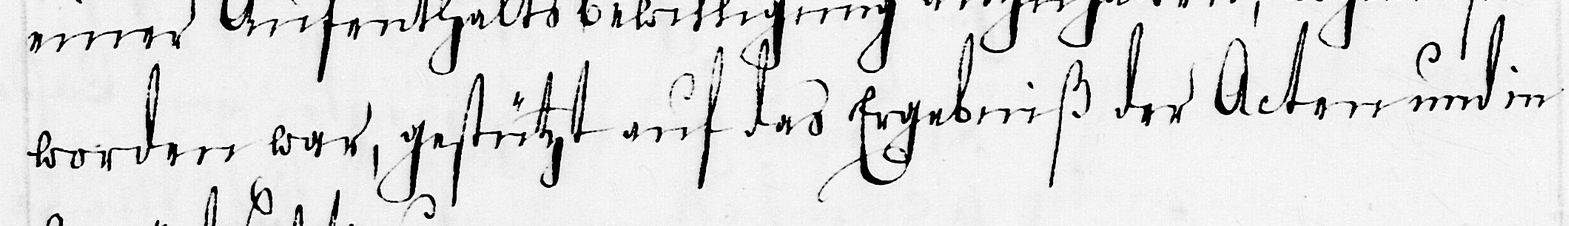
worden war, gestützt auf das Ergebniß der Acten und in
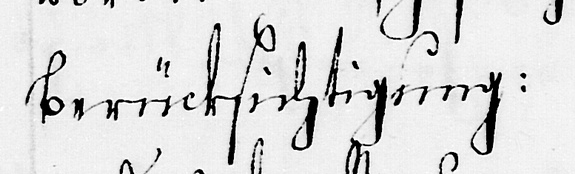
Berücksichtigung:
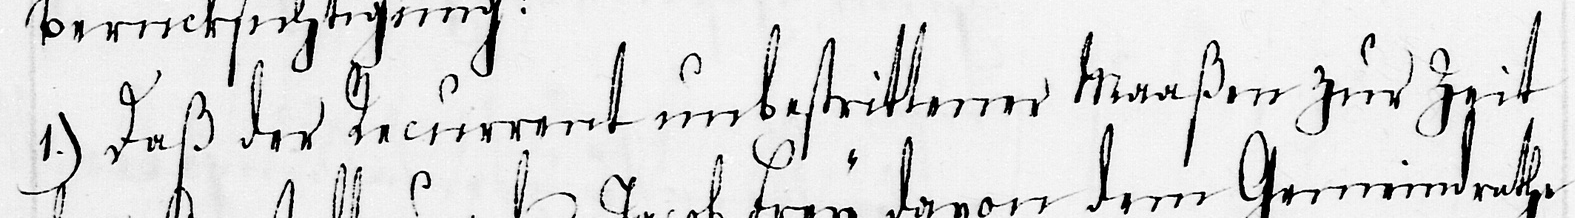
1.) Daß der Recurrent unbestrittener Maaßen zur Zeit
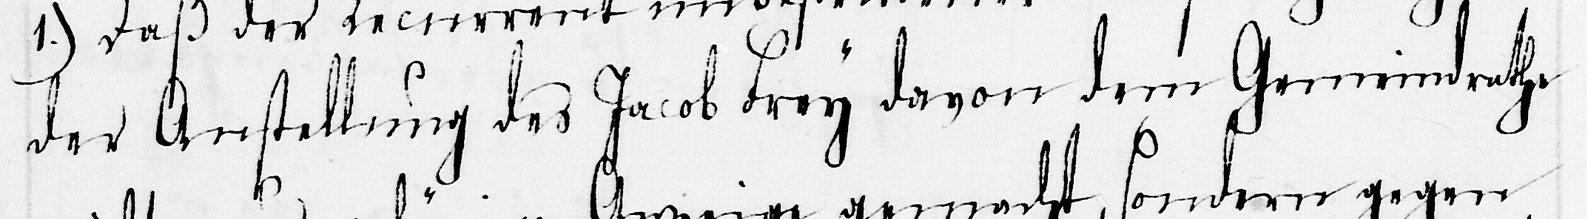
der Anstellung des Jacob Frey davon dem Gemeindrathe
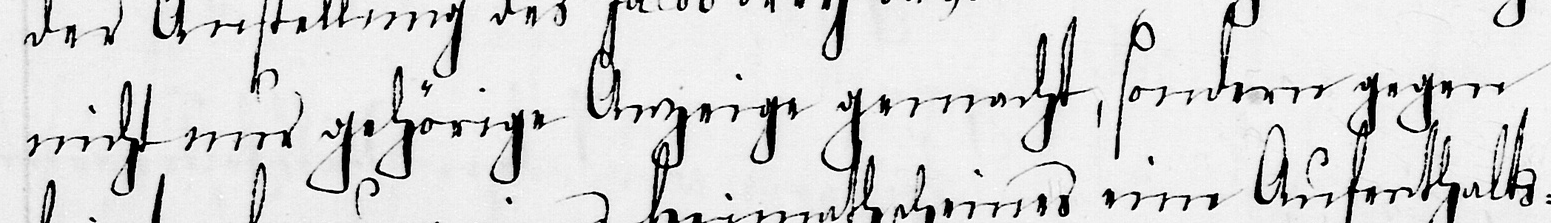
nicht nur gehörige Anzeige gemacht, sondern gegen
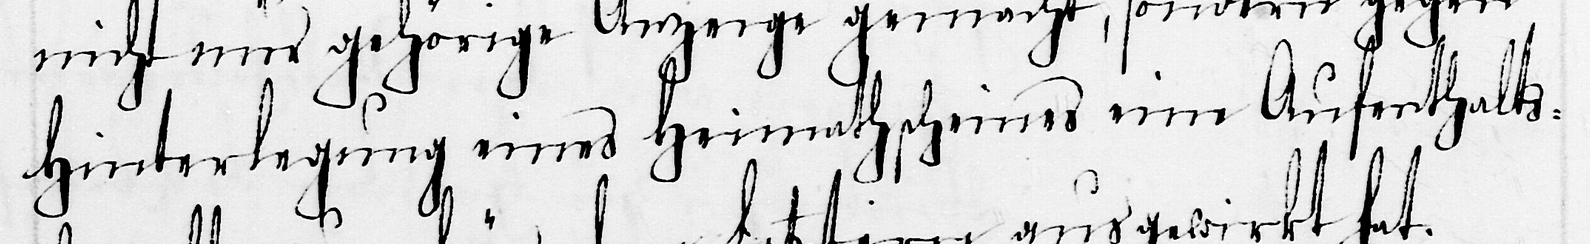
Hinterlegung eines Heimathscheines eine Aufenthalts¬
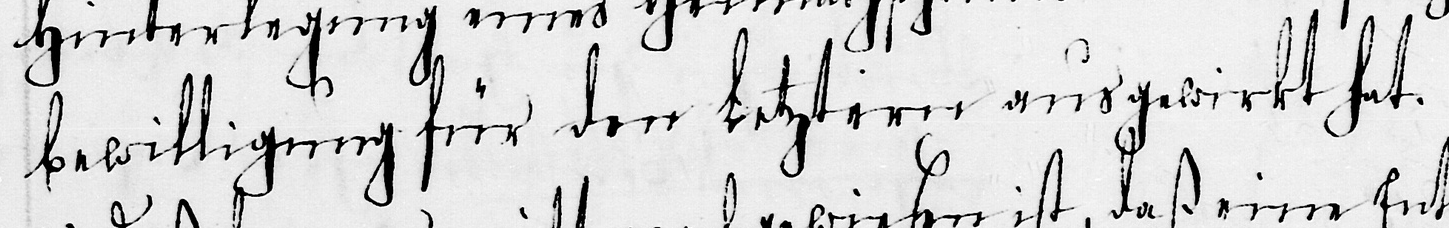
bewilligung für den Letztern ausgewirkt hat.
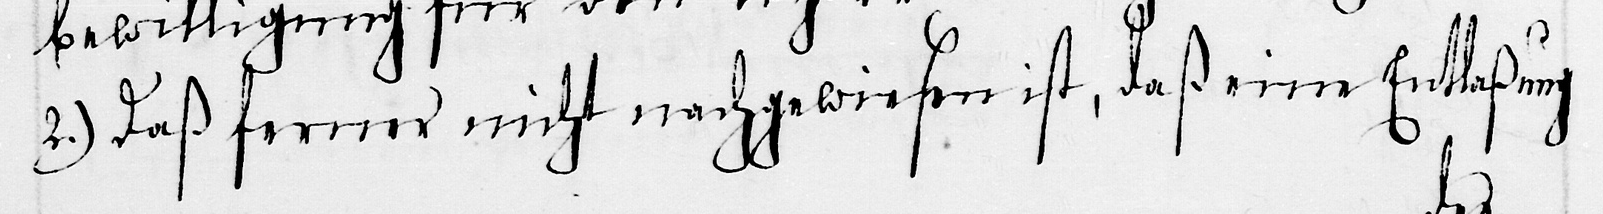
2.) Daß ferner nicht nachgewiesen ist, daß eine Entlaßung
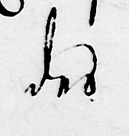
des
